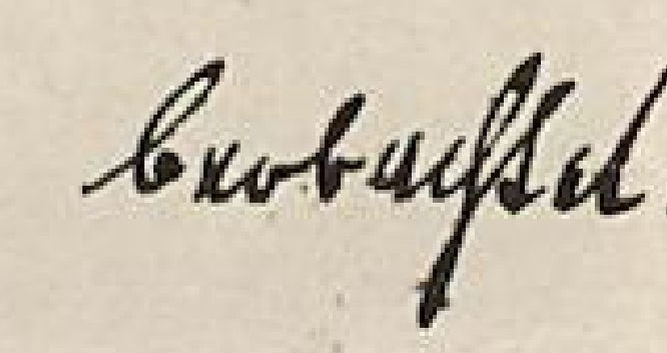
beobachtet
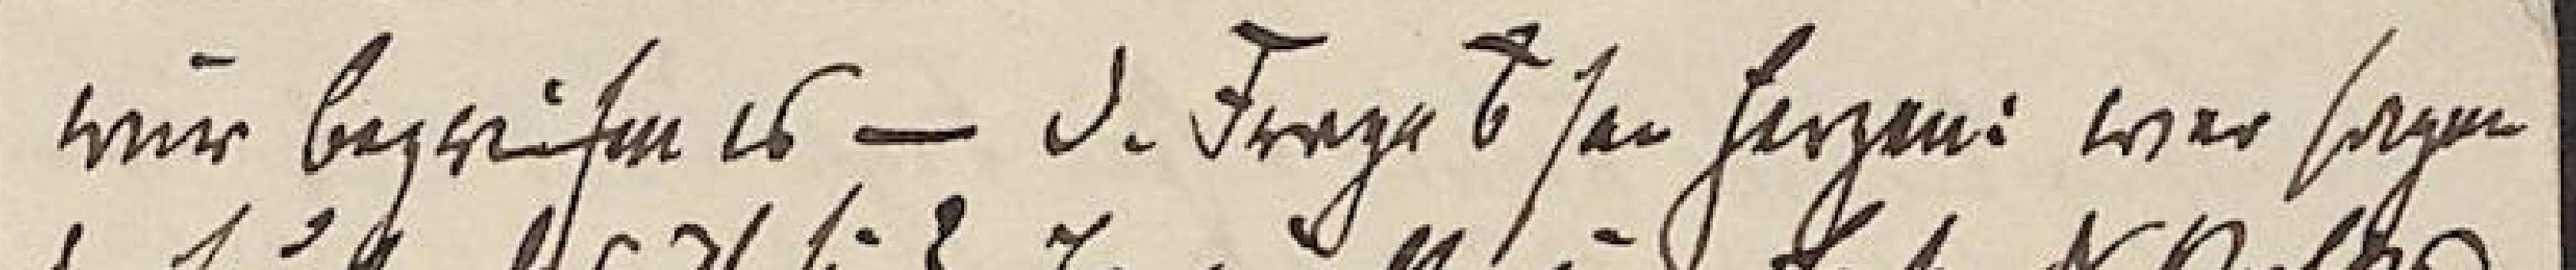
wir begreife es _ d. Frage s snm Herzen: wer sagen
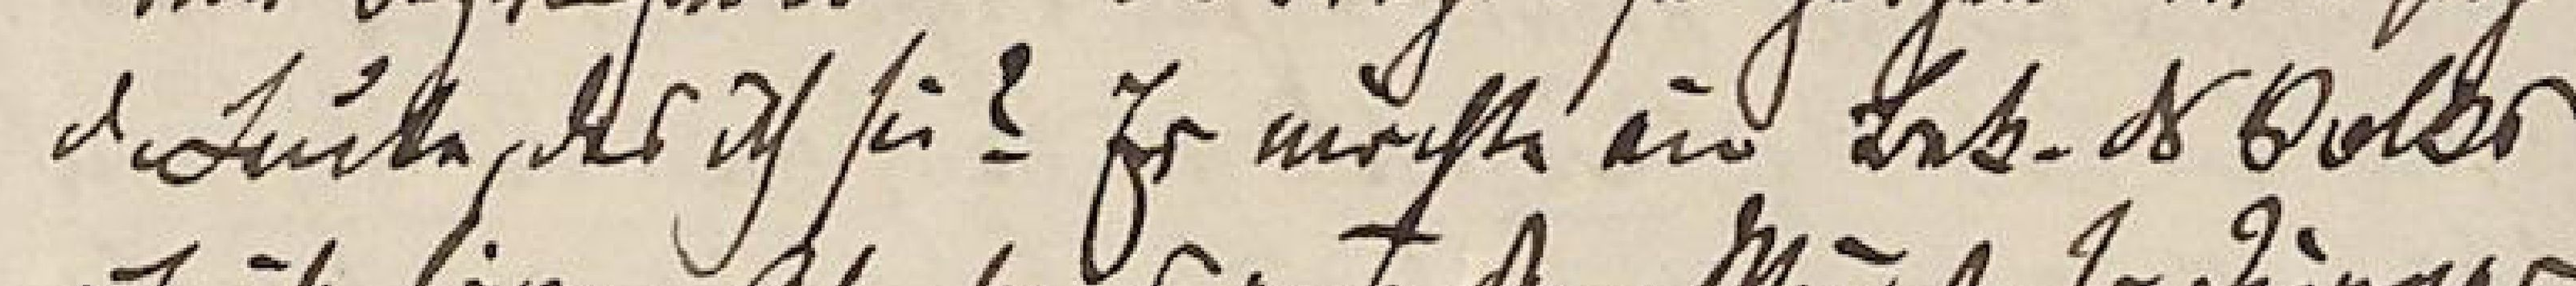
d. Leute, das ich sei? Er möchte ein Bek. ds Volkes
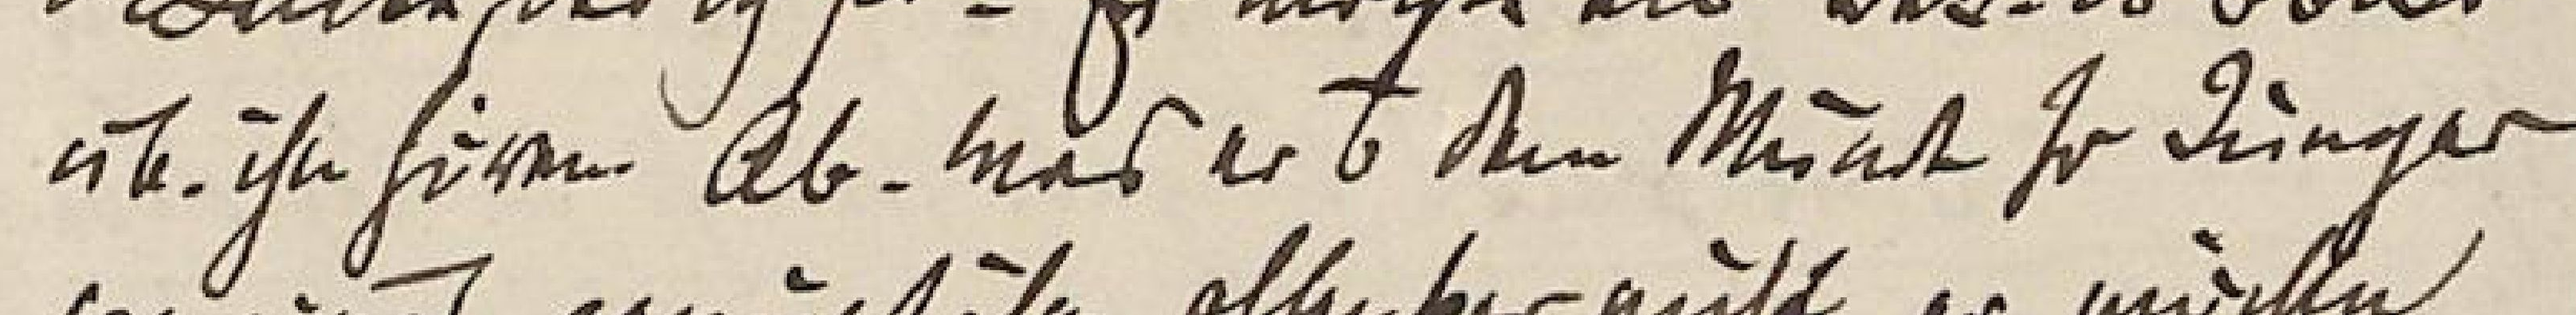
üb. ihn hören. Ab. was er s dem Munde sr Jünger
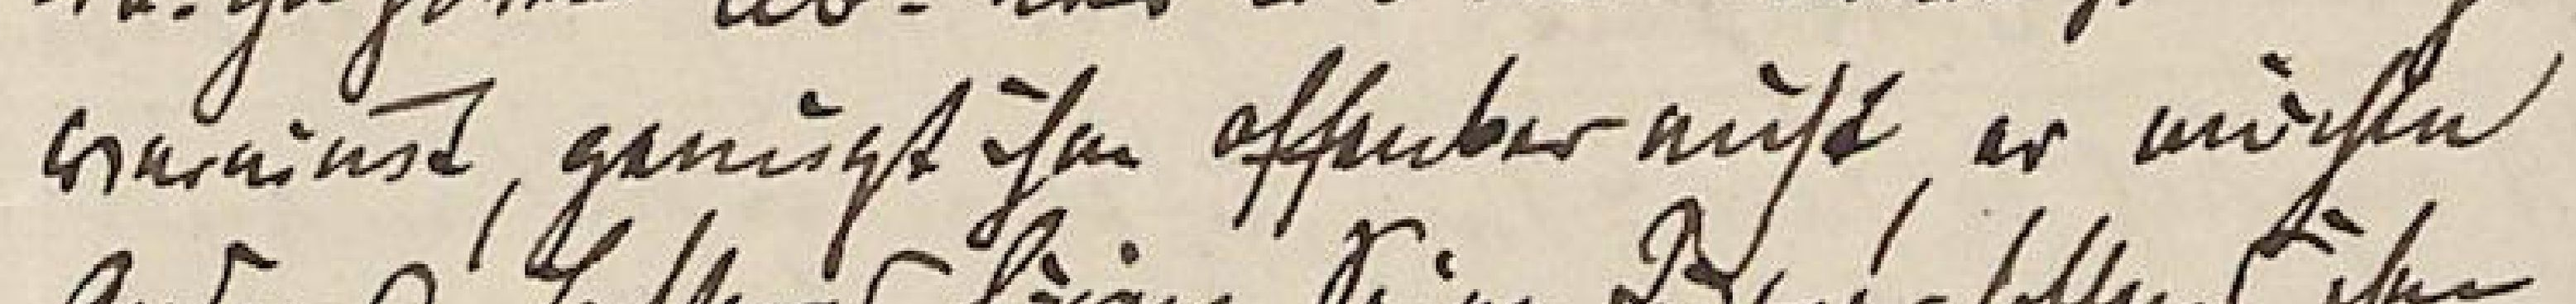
vernimt, genügt ihm offenbar nicht, er möchte
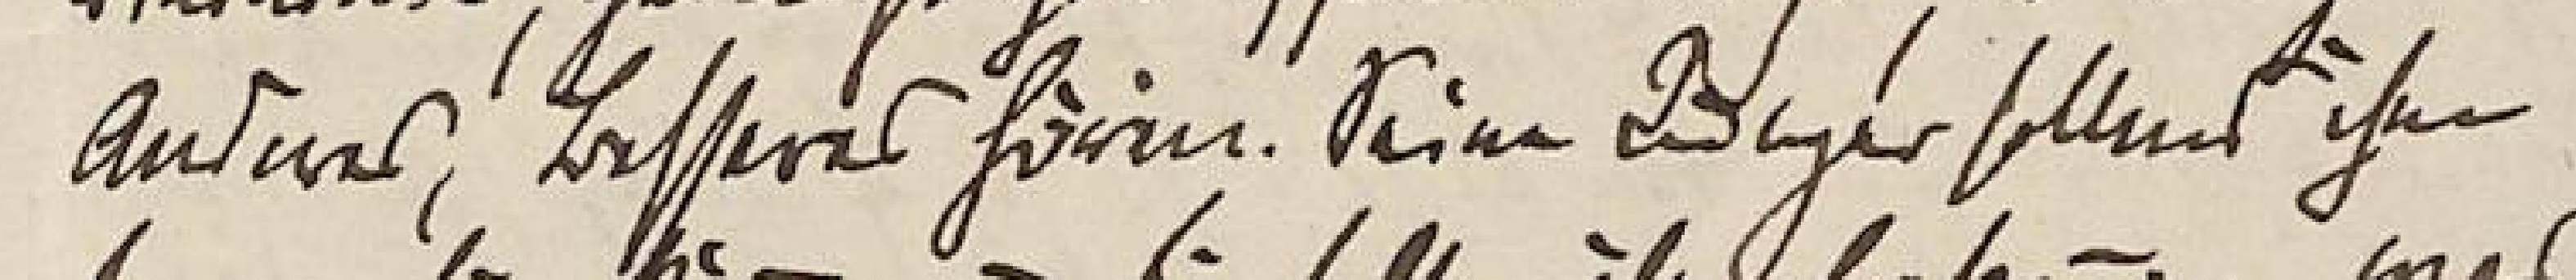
Anderes, Besseres hören. Seine Jünger sollens ihm
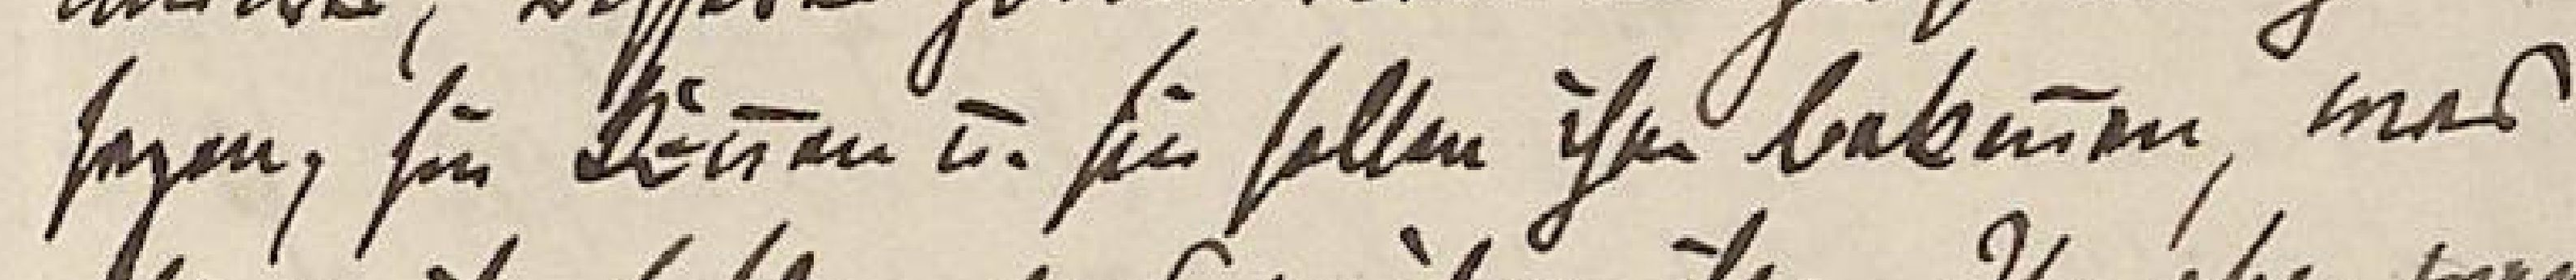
sagen, sie können u. sie sollen ihn bekenen, was
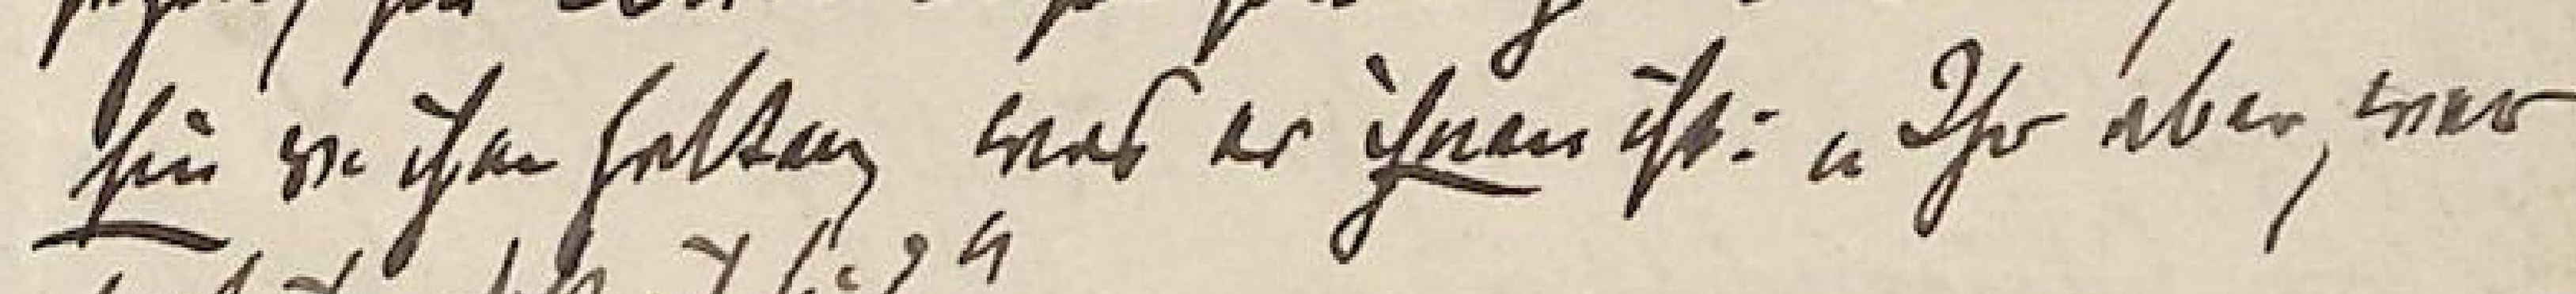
sie v. ihm halten, was er ihnen ist: "Ihr aber, wer
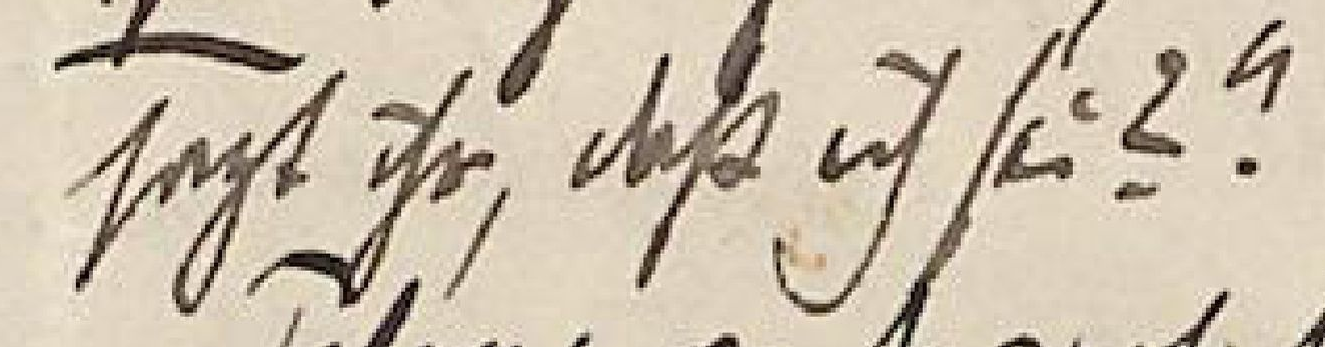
sagt ihr, daß ich sei?"
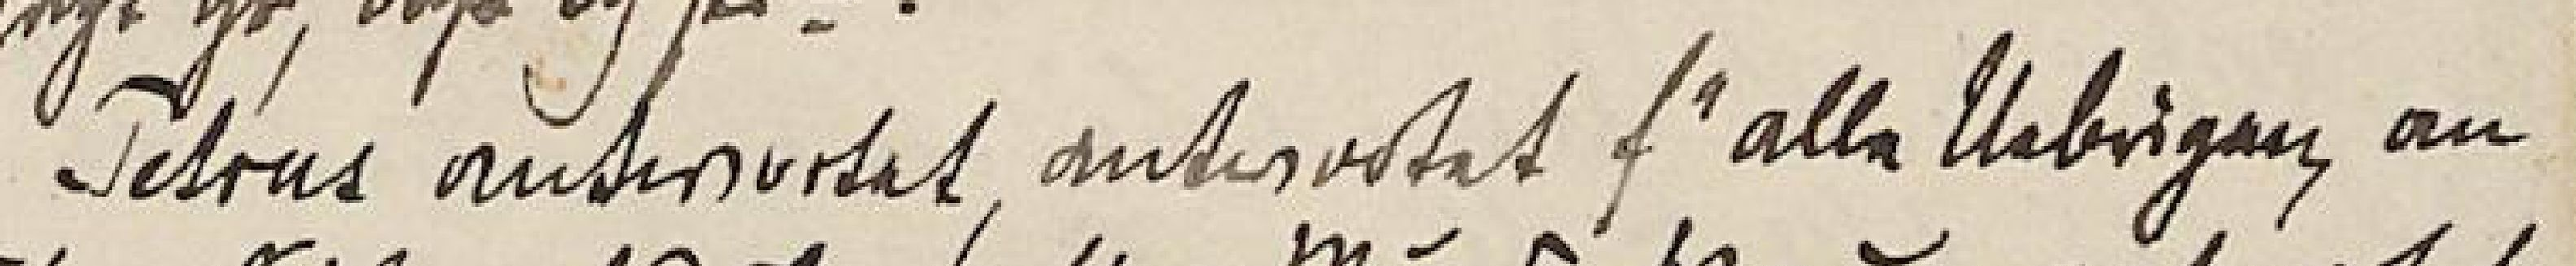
Petrus antwortet, antwortet fü alle Uebrigen, an
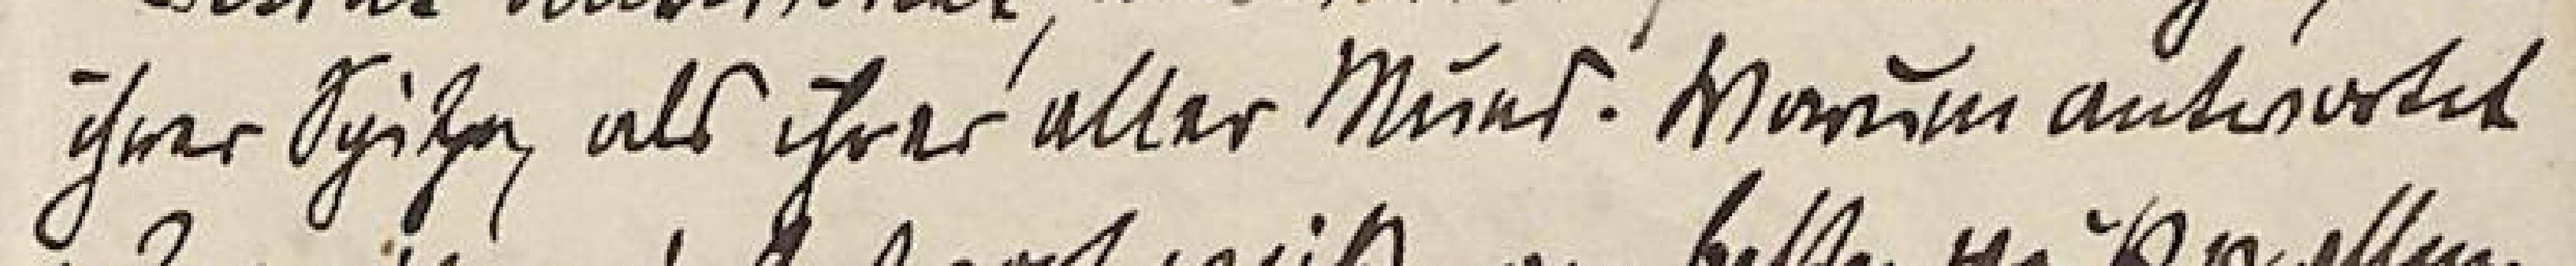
ihrer Spitze, als ihrer aller Mund. Warum antwortet
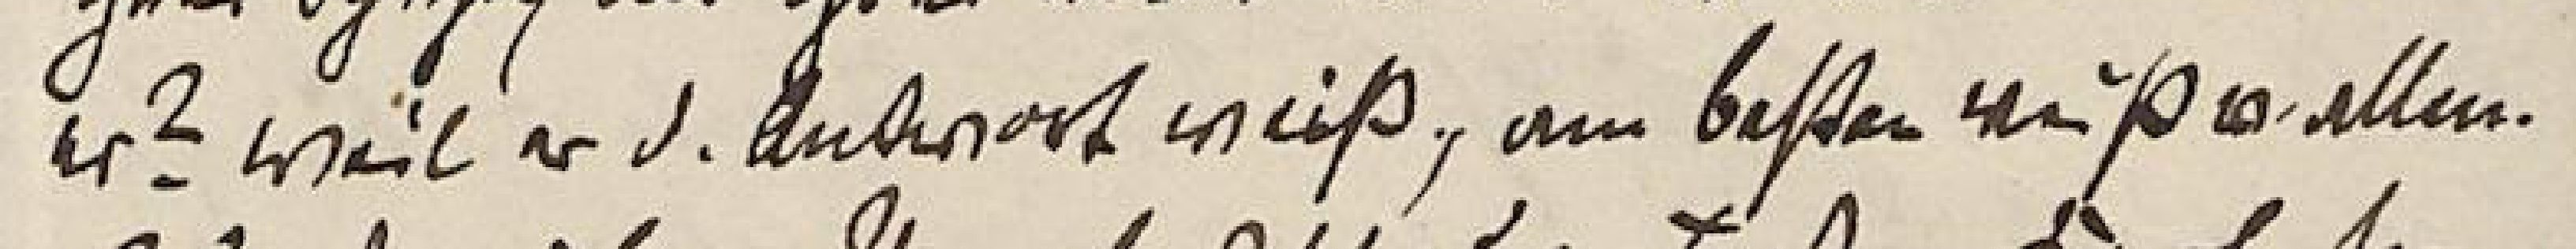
er? weil er d. Antwort weiß, am besten weiß v. allen.
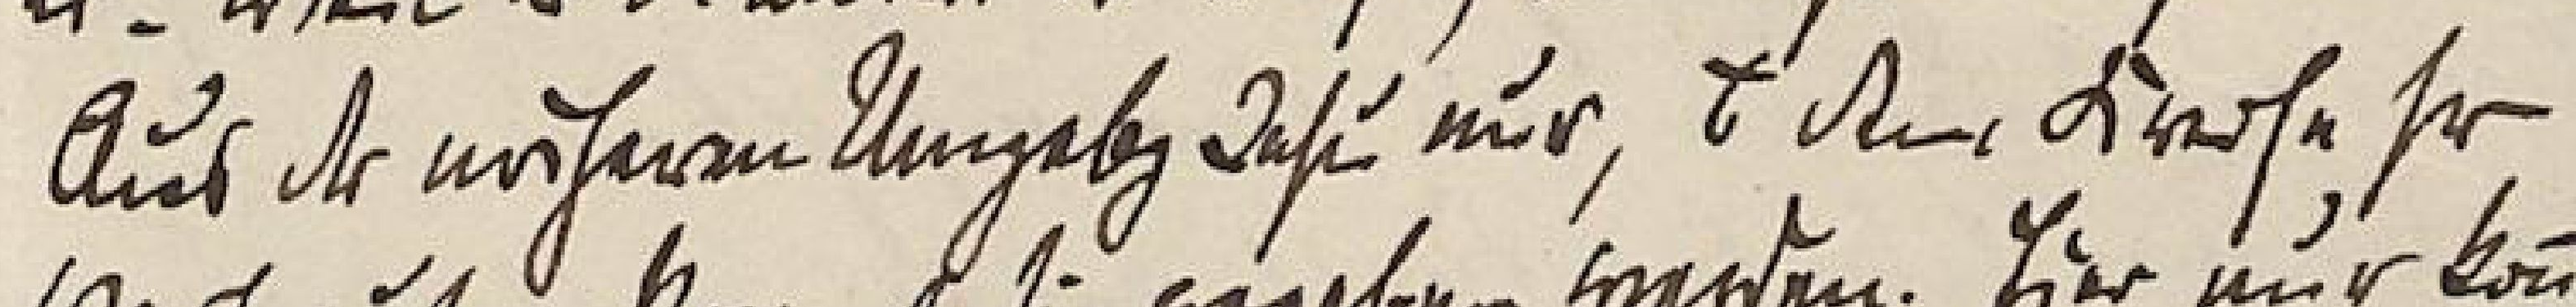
Aus der näheren Umgebg Jesu nur, s dem Kreise sr
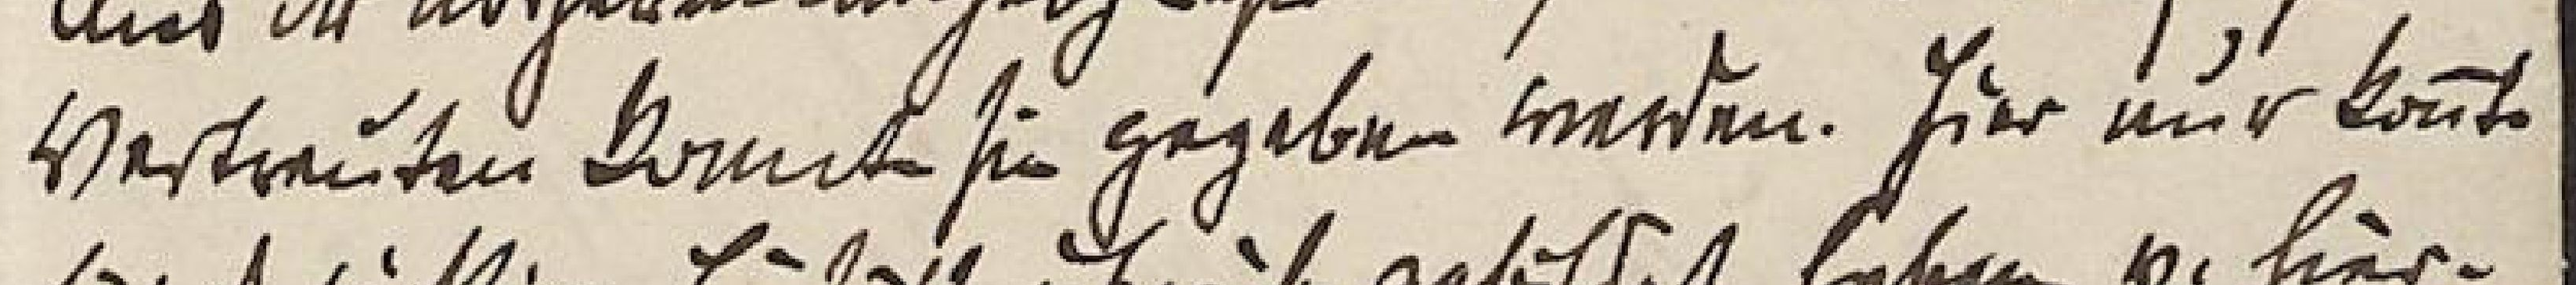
Vertrauten konnten sie gegeben werden. Hier nur konte
